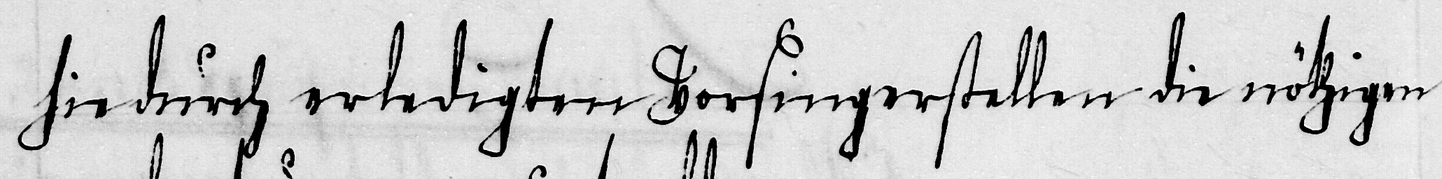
hiedurch erledigten Vorsingerstellen die nöthigen
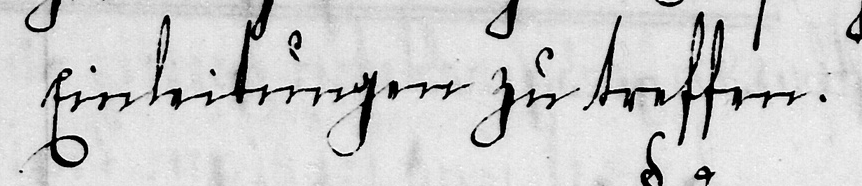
Einleitungen zu treffen.
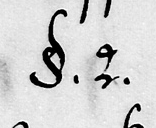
§. 2.
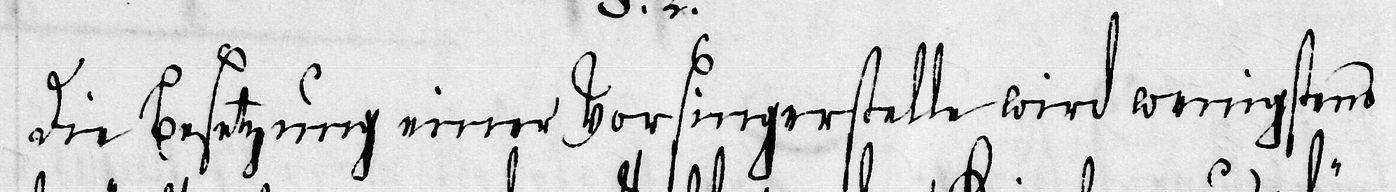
Die Besetzung einer Vorsingerstelle wird wenigstens
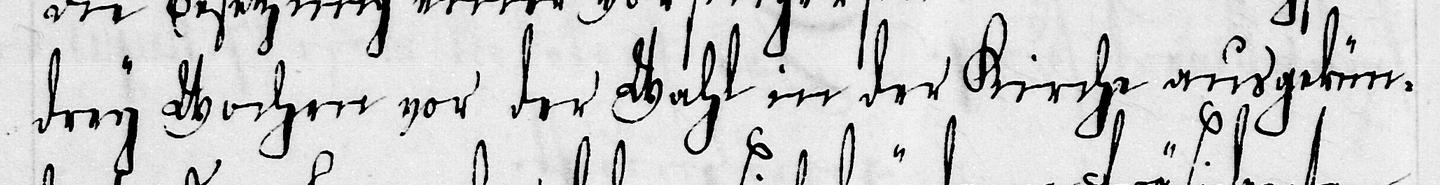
drey Wochen vor der Wahl in der Kirche ausgekün¬
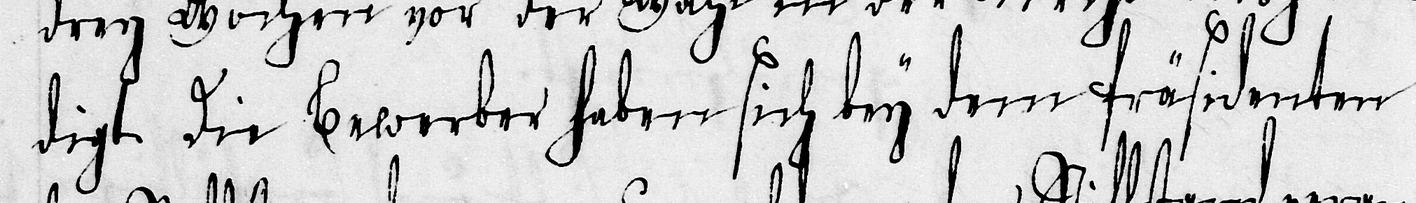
digt. Die Bewerber haben sich bey dem Präsidenten
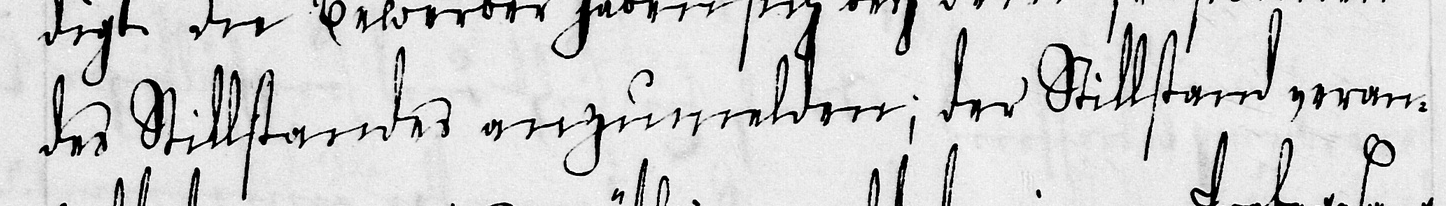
des Stillstandes anzumelden; der Stillstand veran¬
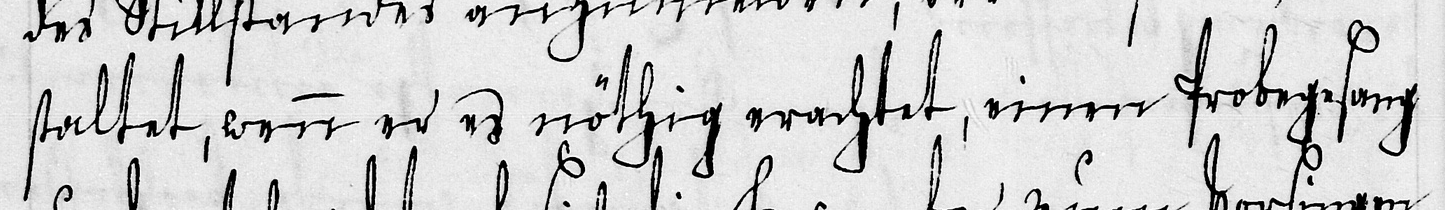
staltet, wenn er es nöthig erachtet, einen Probegesang
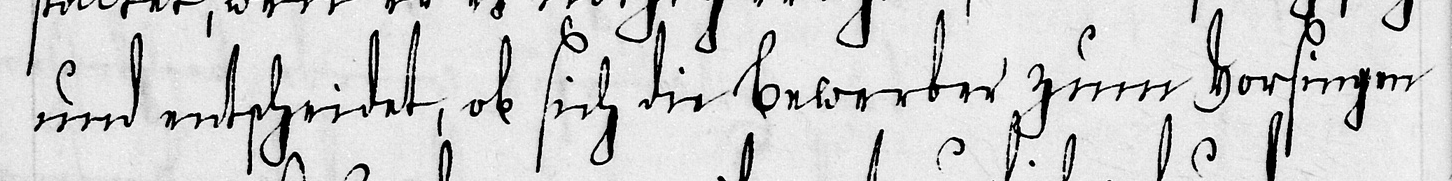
und entscheidet, ob sich die Bewerber zum Vorsingen
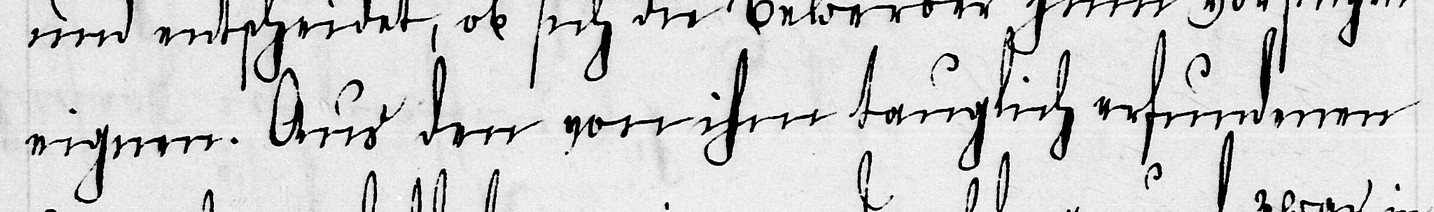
eignen. Aus den von ihm tauglich befundenen
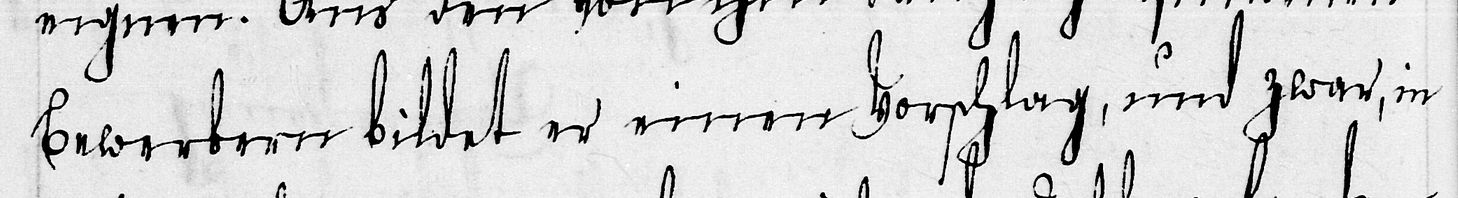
Bewerbern bildet er einen Vorschlag, und zwar, in
